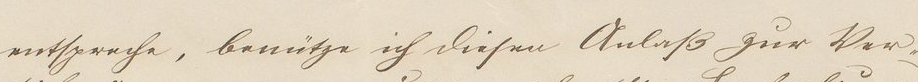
entspreche, benütze ich diesen Anlaß zur Ver-
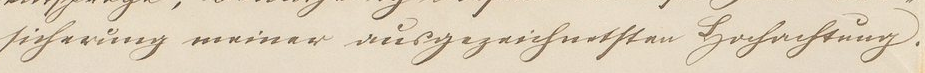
sicherung meiner ausgezeichnetsten Hochachtung.
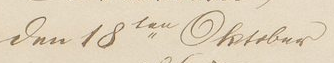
den 18ten Oktober
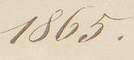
1865.
